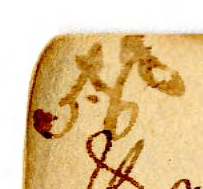56
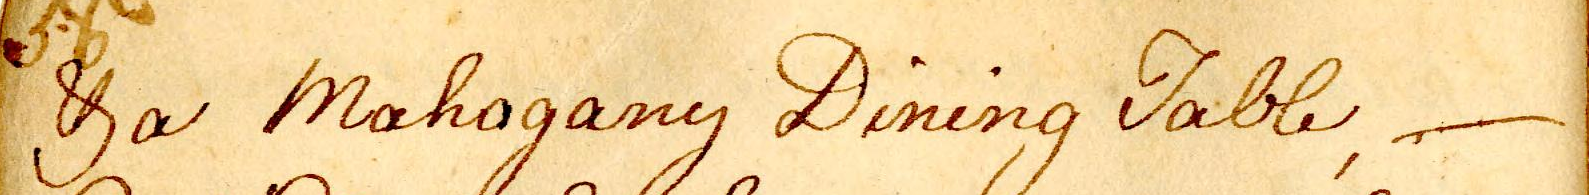& a Mahogany Dining Table,-
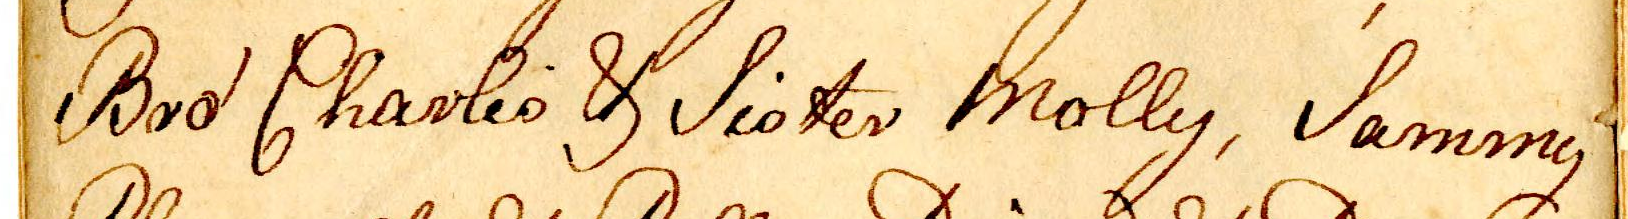Bro' Charles & Sister Molly, Sammy
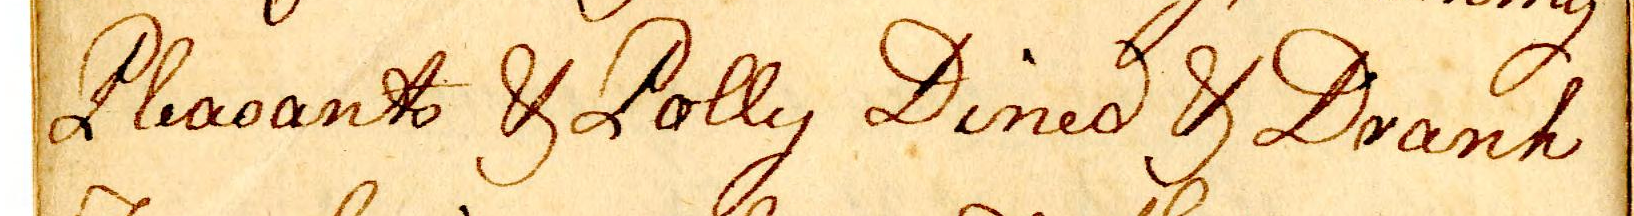Pleasants & Polly Dined & Drank
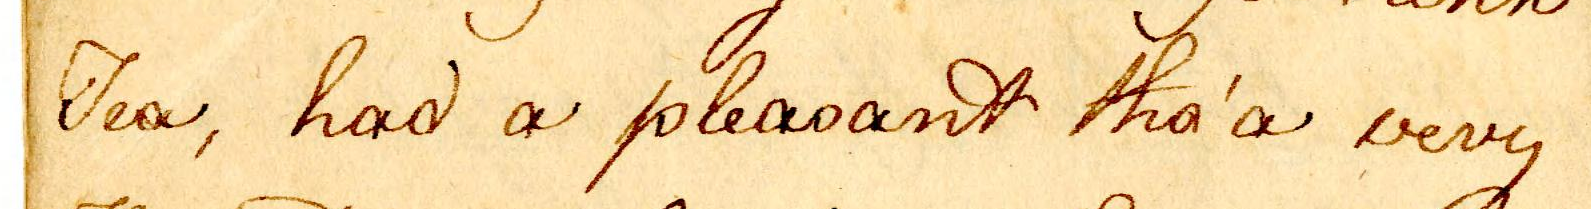Tea, had a pleasant tho' a very
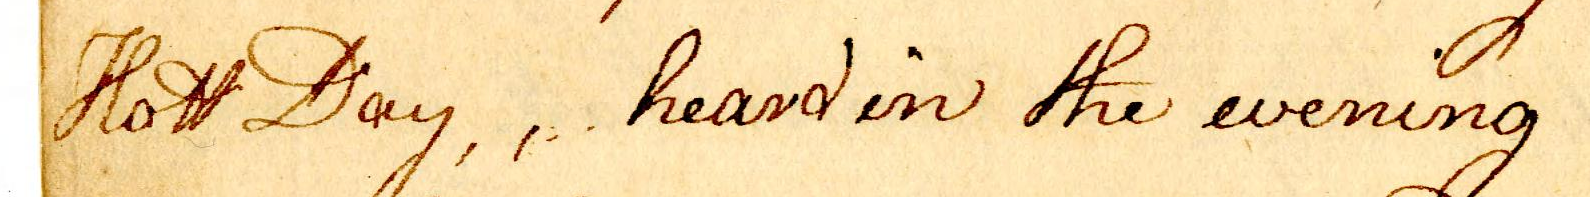Hott Day, , heard in the evening
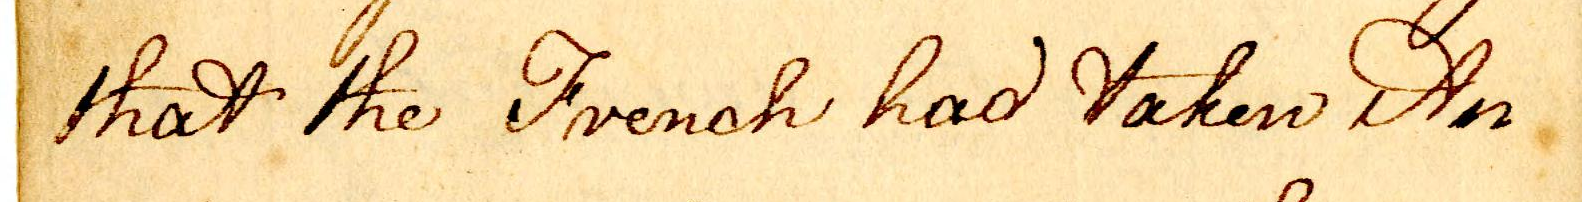that the French had taken An
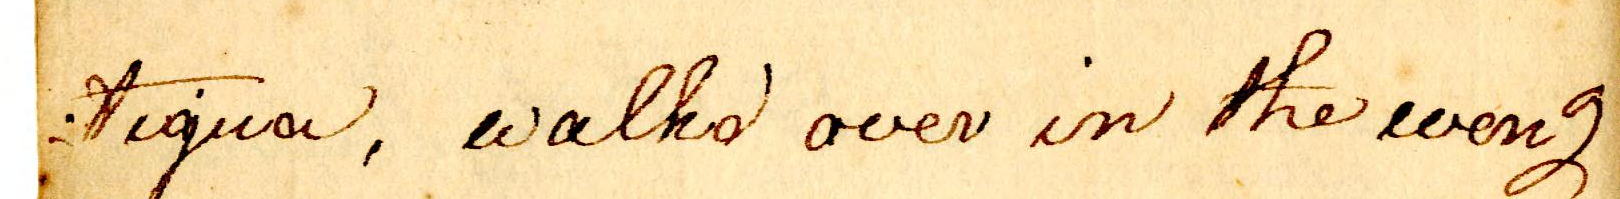-tigua, walkd over in the even^g
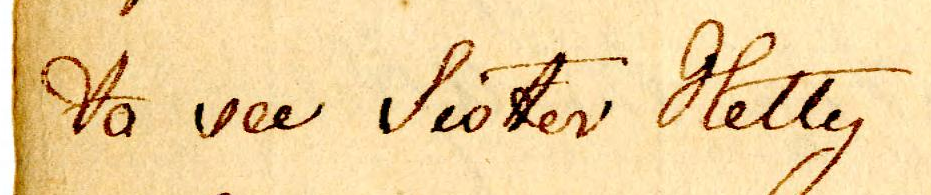to see Sister Hetty
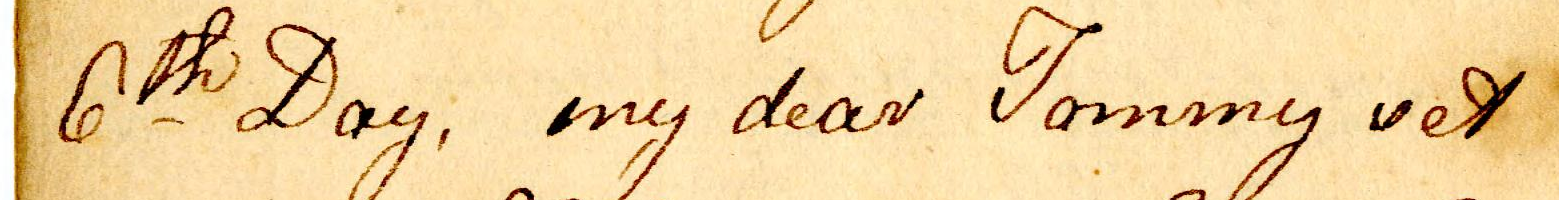6^th Day, my dear Tommy set
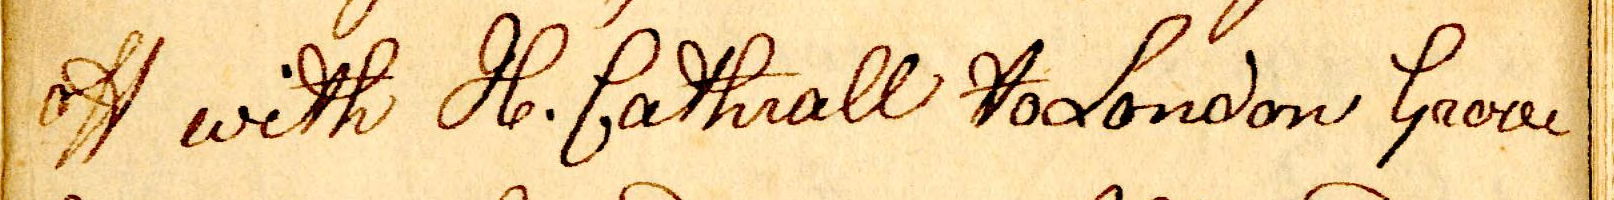off with H. Cathrall to London Grove
